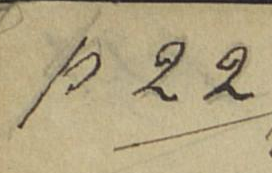p 22
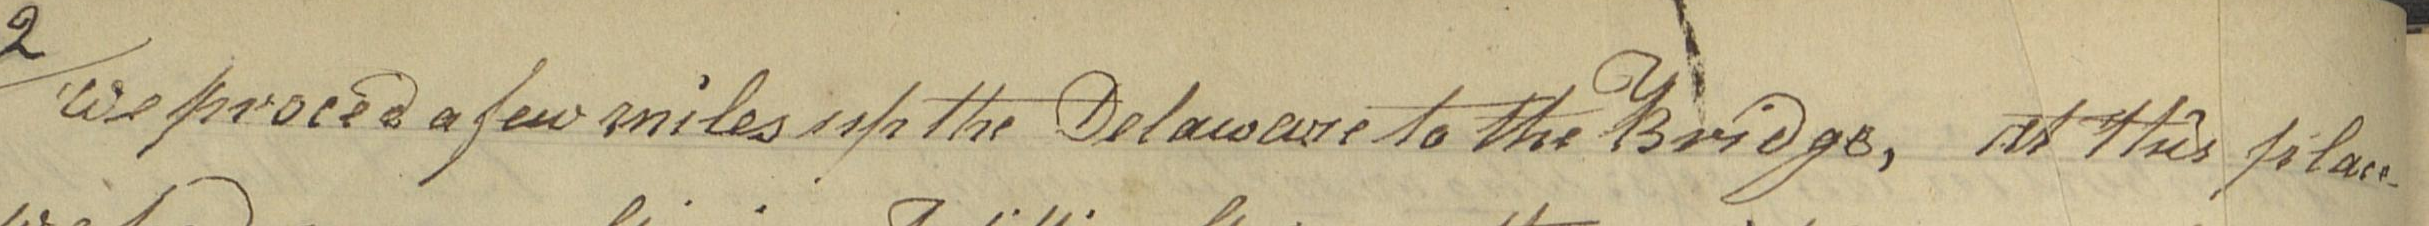We proced a few miles up the Delaware to the Bridge, At this place
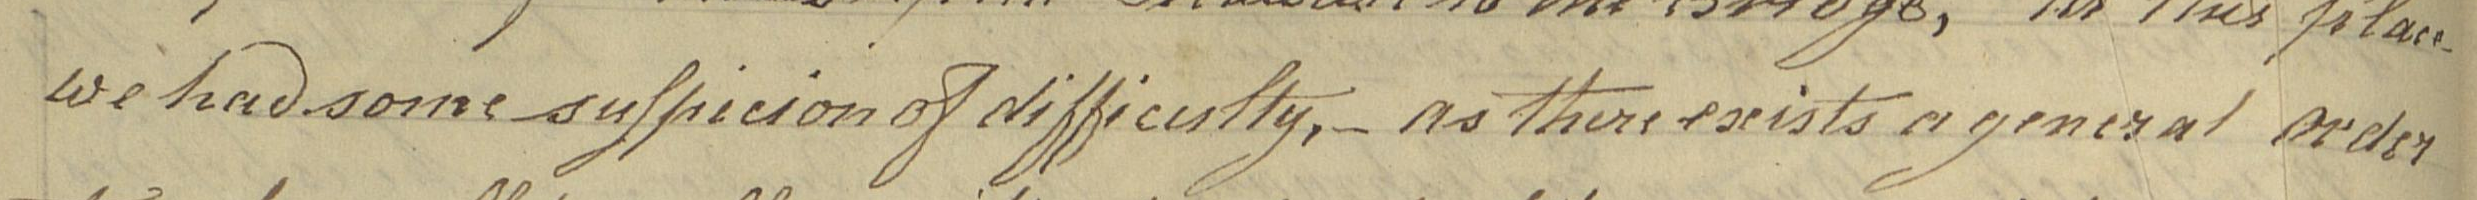we had some suspicion of difficulty, as there exists a general Order
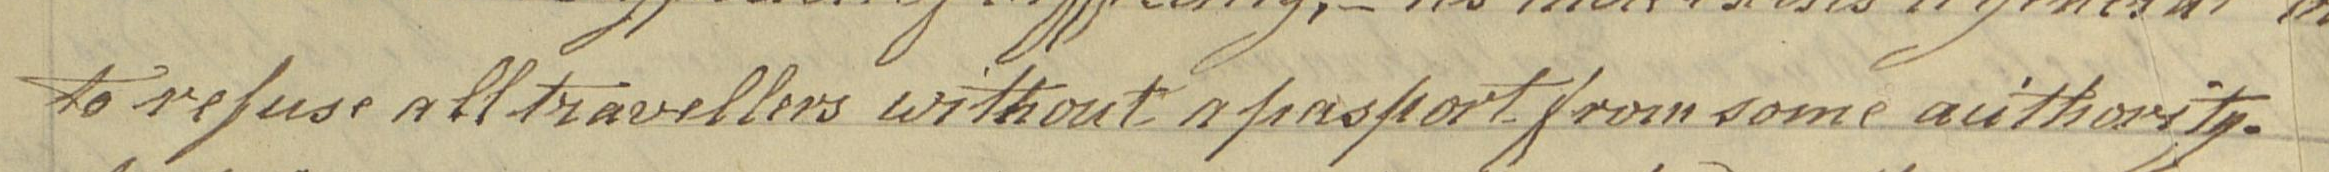to refuse all travellers without a pasport from some authority.
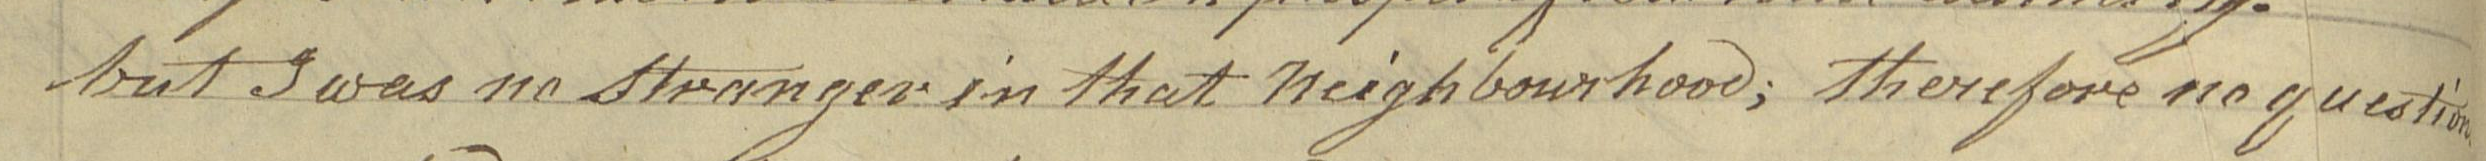but I was no stranger in that neighbourhood; therefore no question
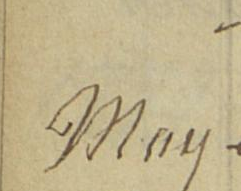May
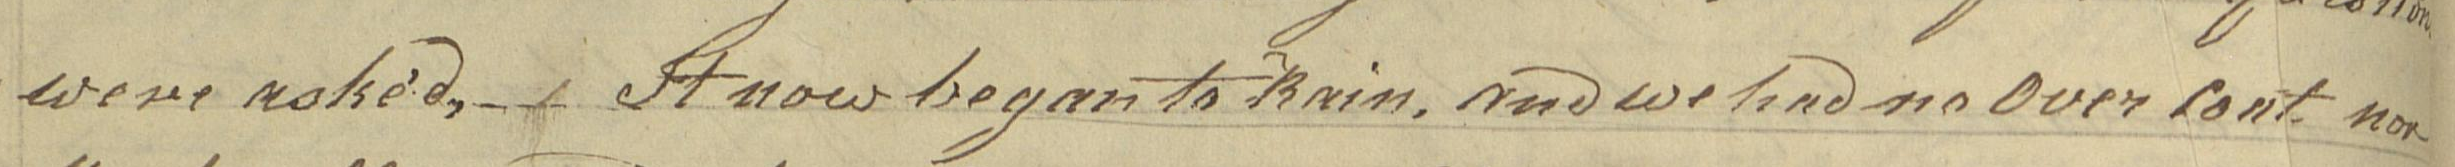were aske'd, It now began to Rain, and we had no over coat. nor
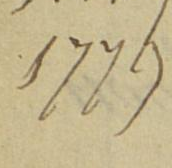1779
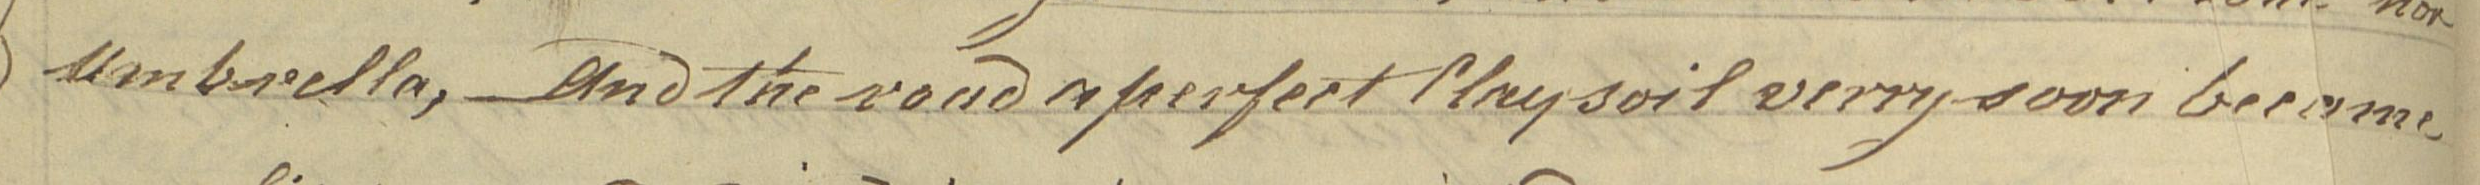umbrella, And the road a perfect clay soil verry soon became
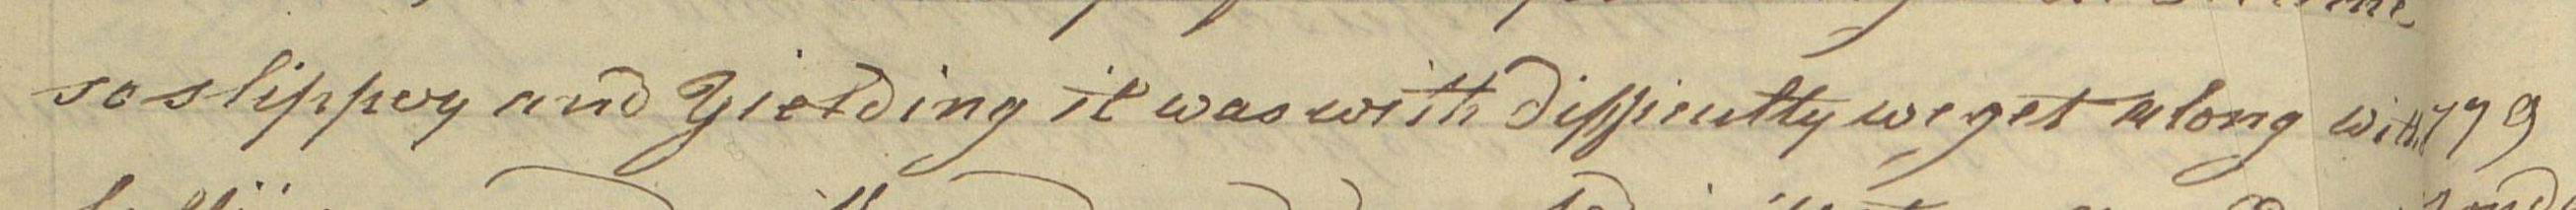so slippery and yielding it was with difficulty we get along with
